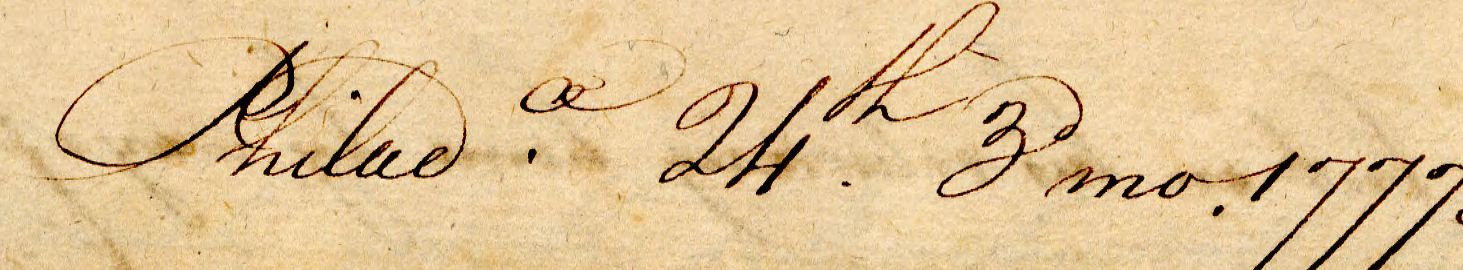Philad^a. 24^th. 3^d mo. 1777
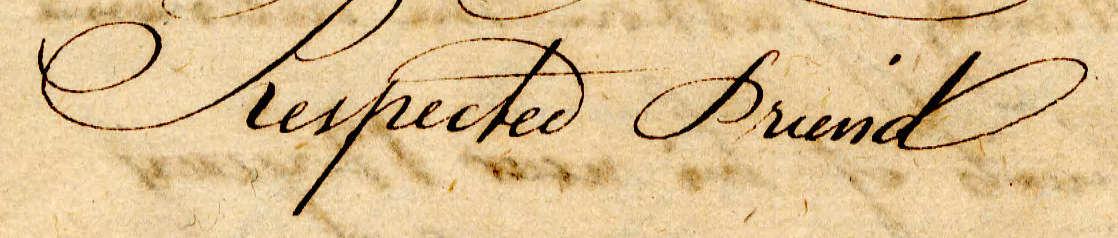Respected Friend
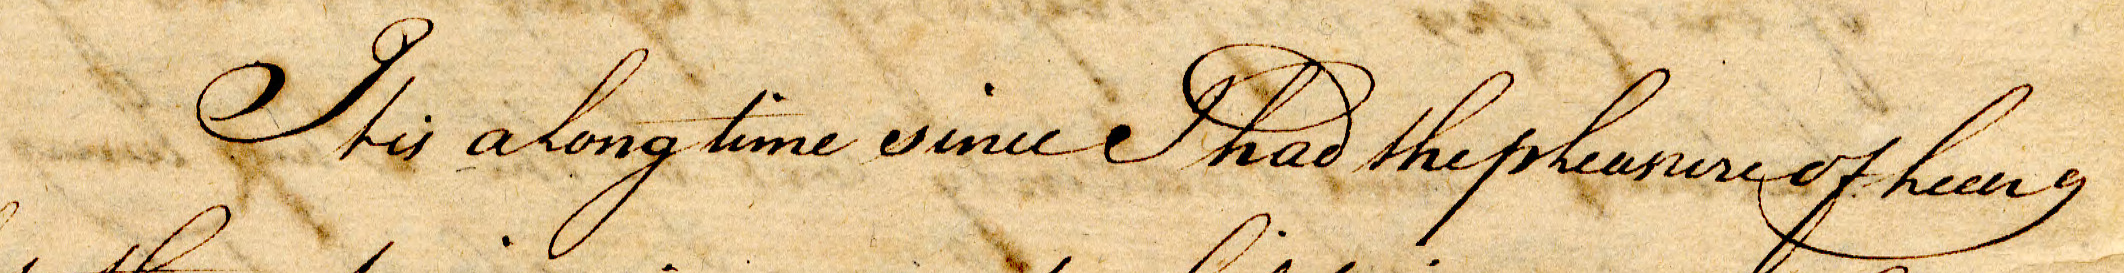It is a Long time since I had the pleasure of hearg
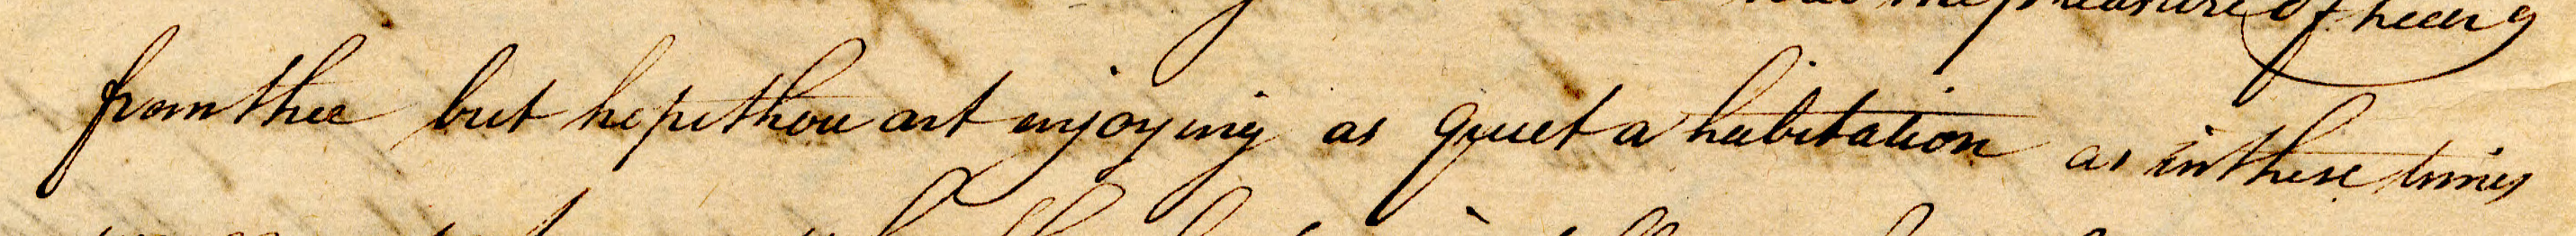from thee but hope thou art enjoying as quiet a habitation as in these times
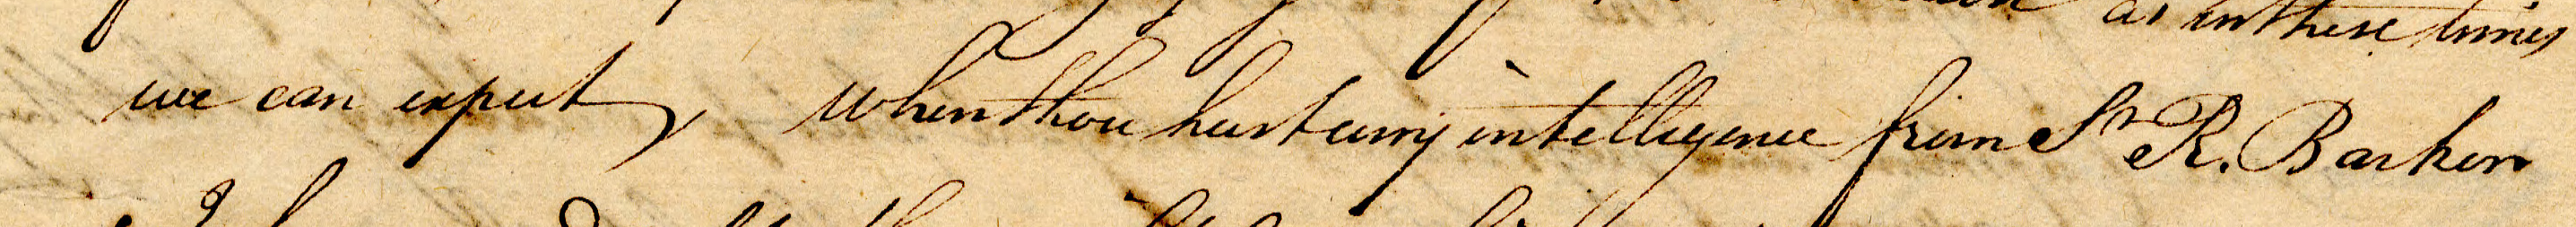we can expect. When thou hast any intelligence from S^r. R. Barker
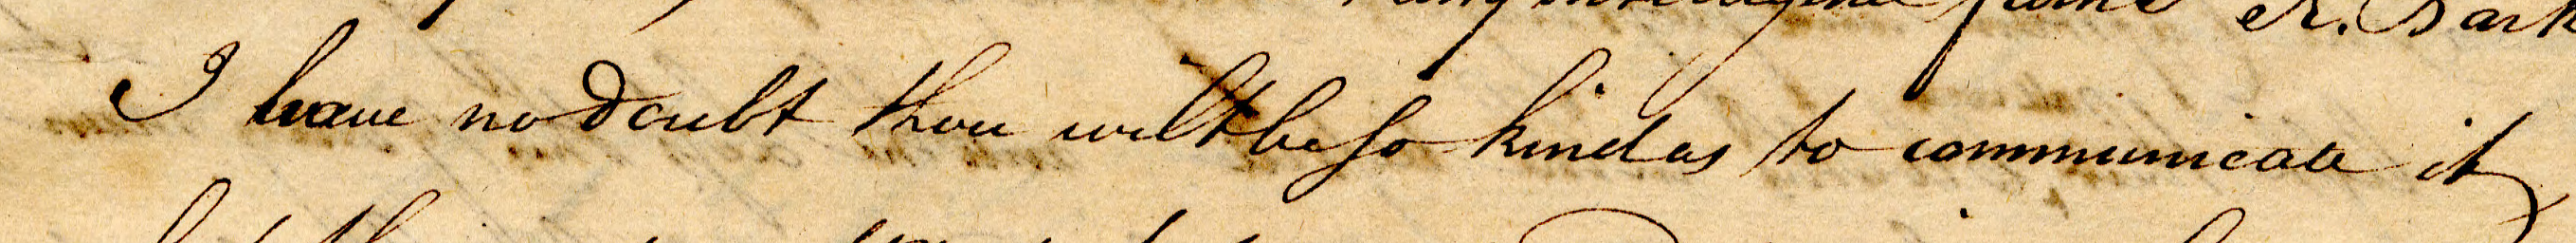I have no doubt thou wilt be so kind as to communicate it,
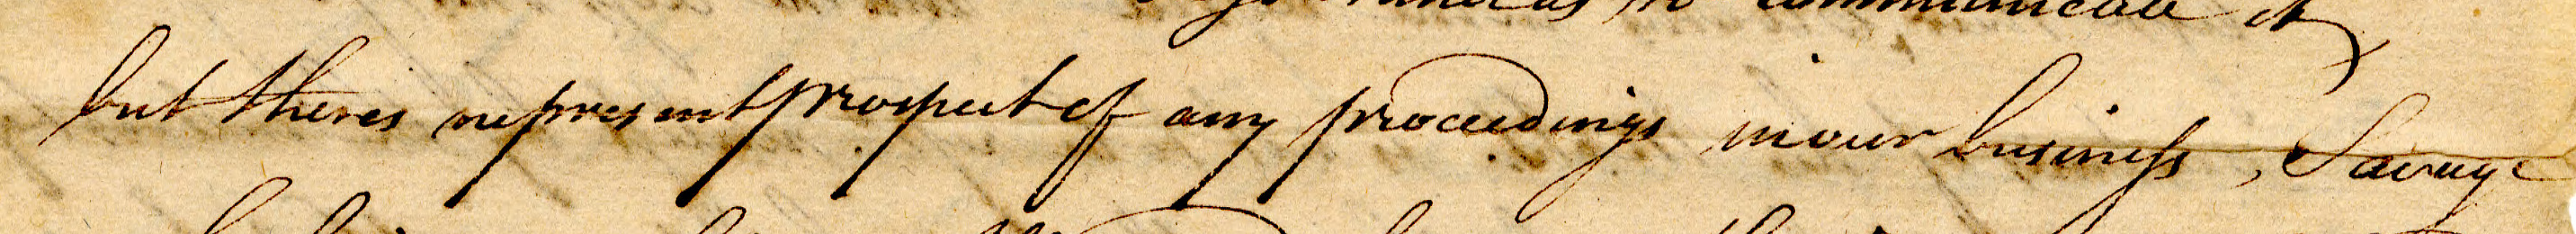but theres no present prospect of any proceedings in our business, Savage
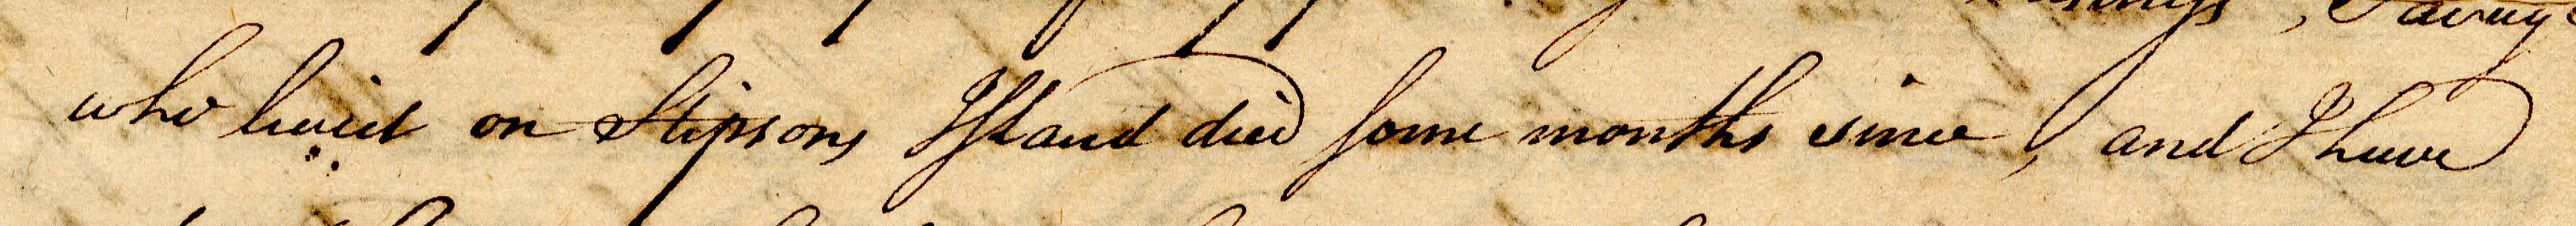who lived on Stipsons Island died some months since, and I have
